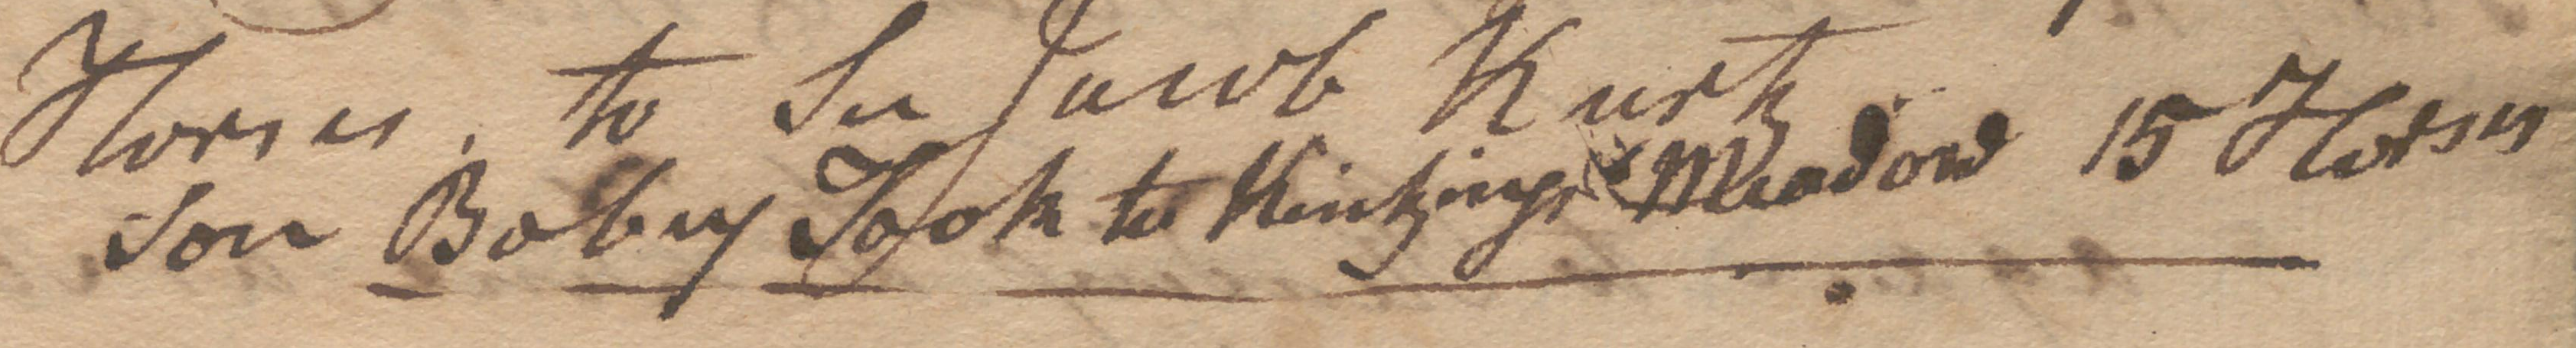son Bobey Took to Kintzings Meadow 15 Horses
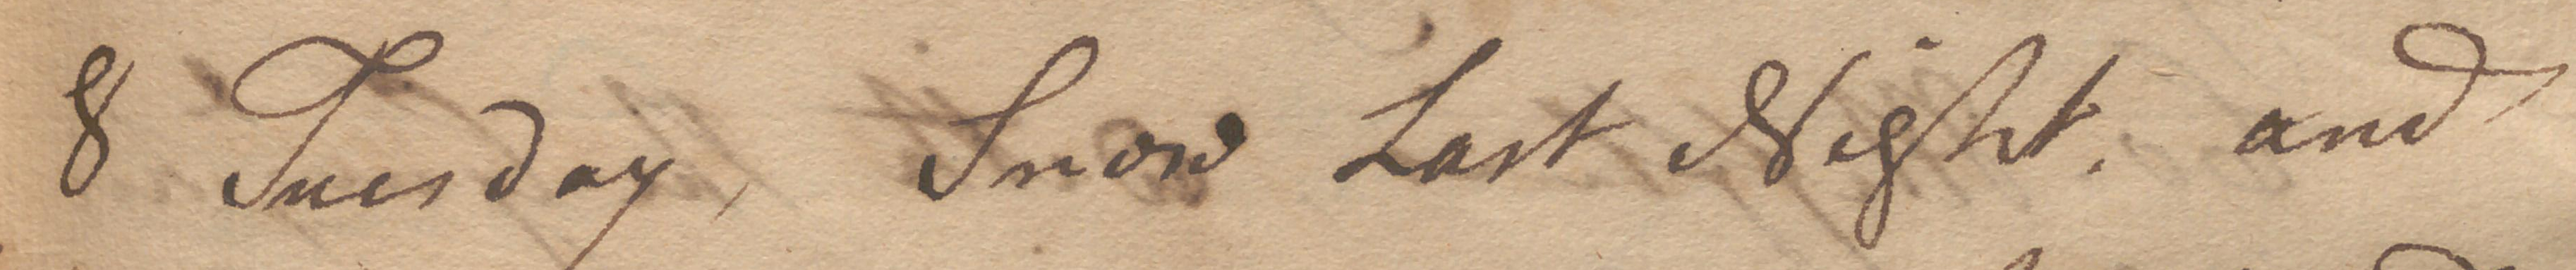8 Tuesday, Snow Last Night and
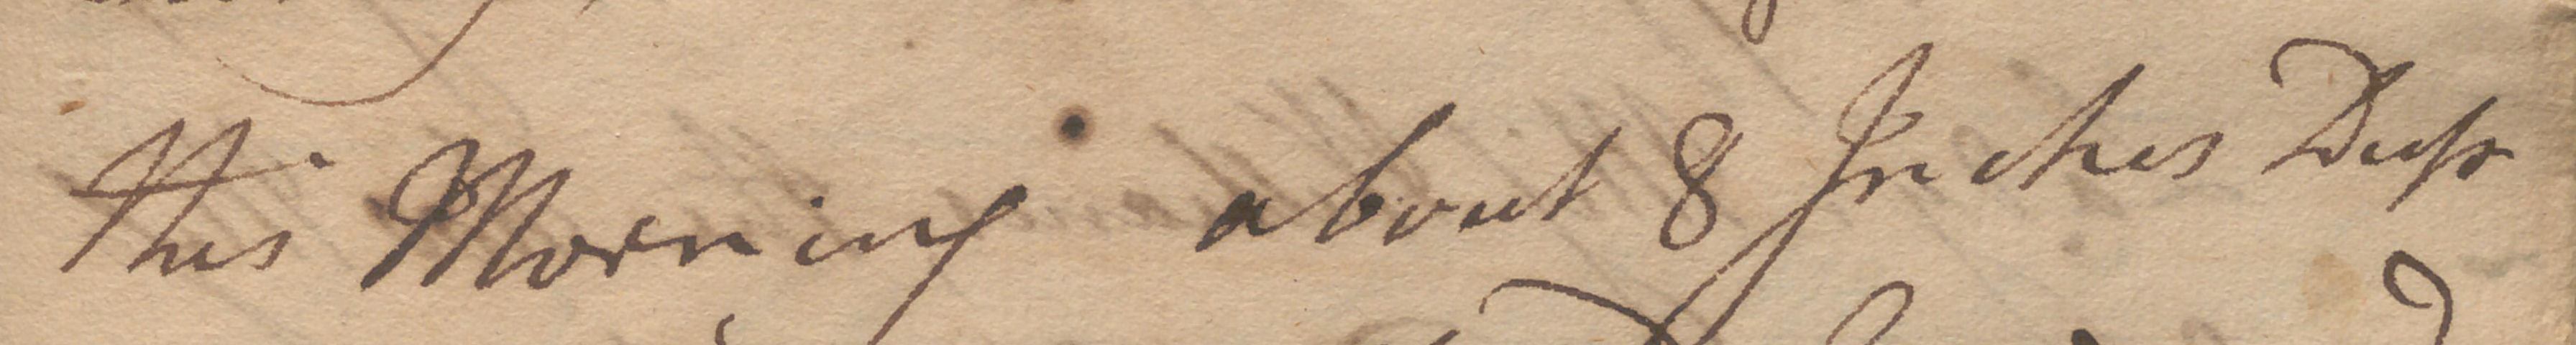this Morning about 8 Inches Deep
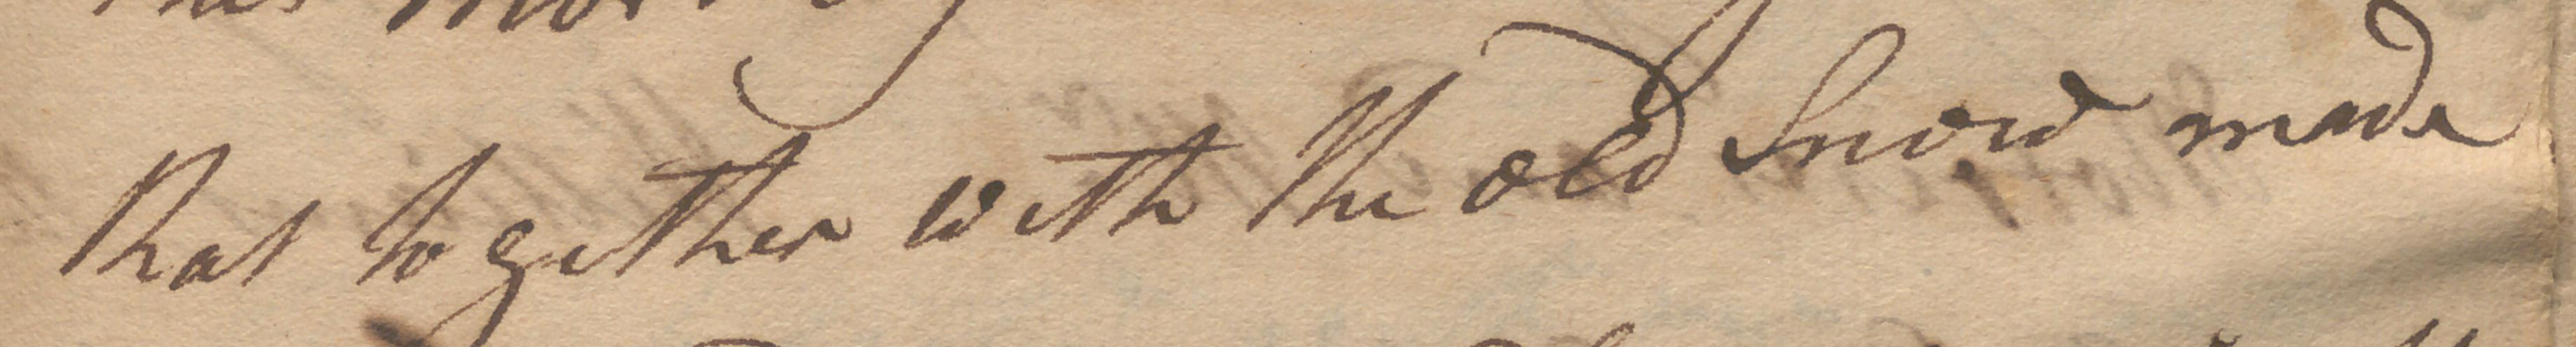that together with the old snow made
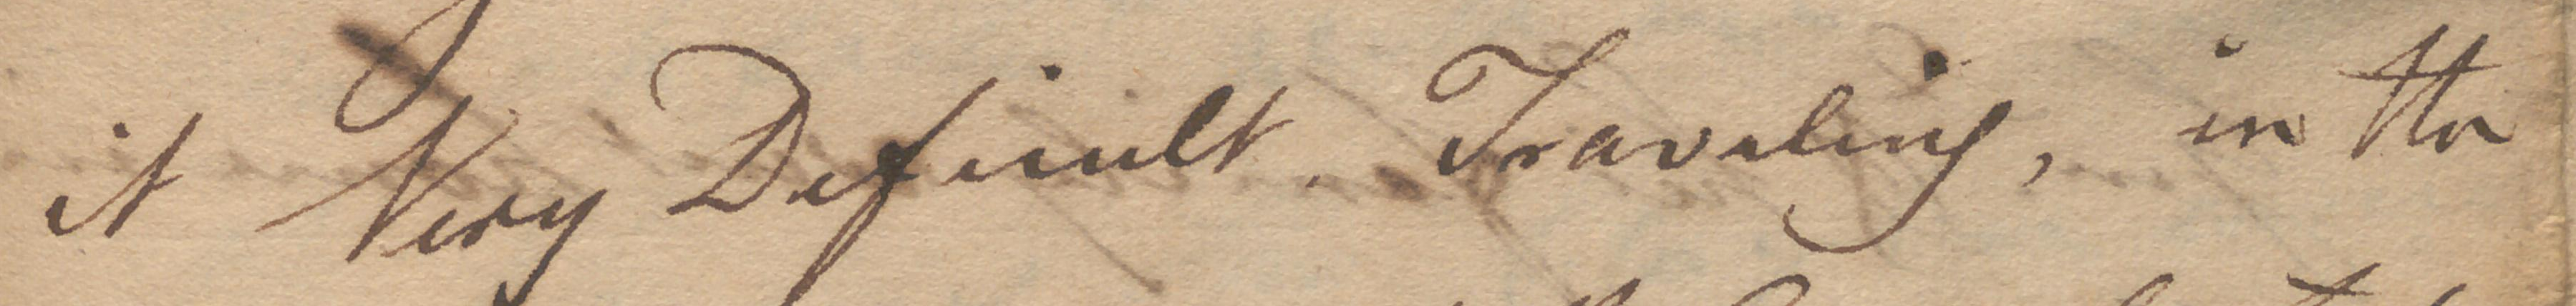it Very Dificult Traveling, in the
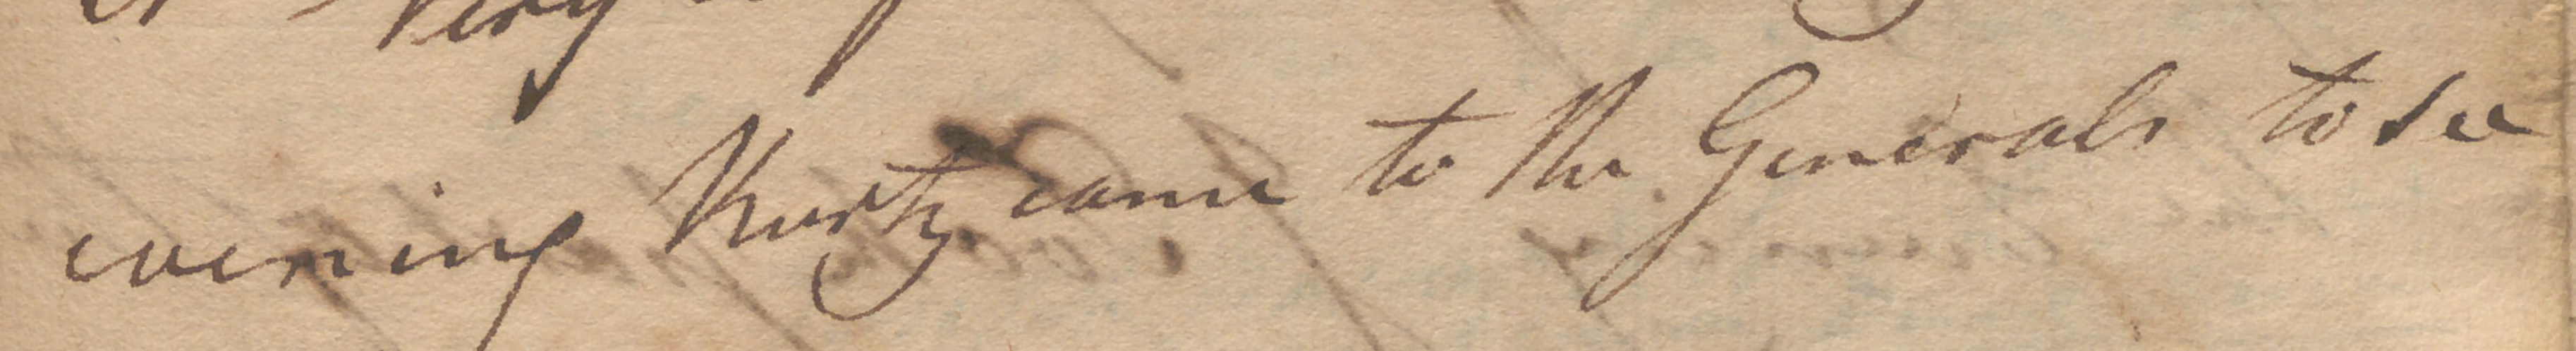evening Kurtz came to the Generals to see
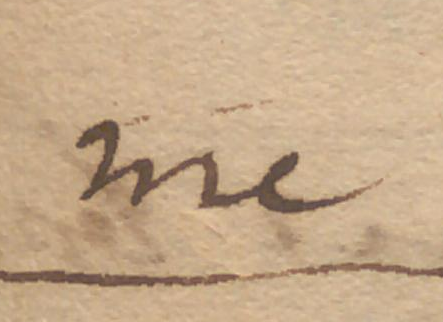me
